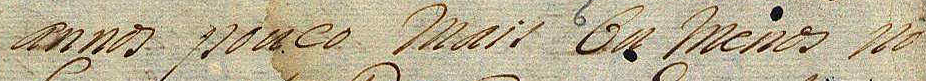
annos pouco mais ou menos no
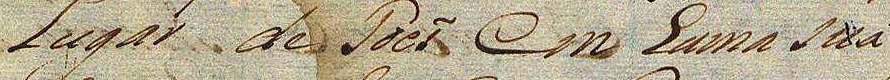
Lugar de Toẽs em huma sua
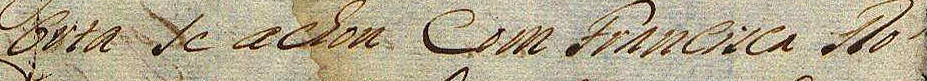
Orta se achou com Francisca Ro
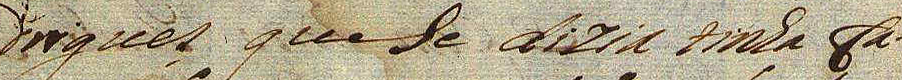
drigues, que Se dizia tinha fa
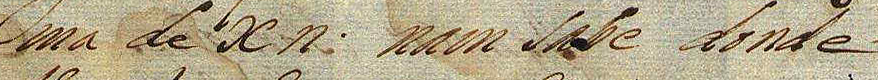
ma de xn. nam sabe donde
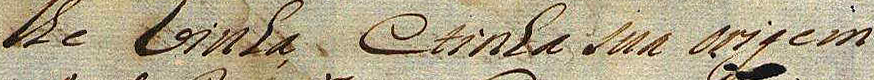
lhe Vinha, e tinha sua origem
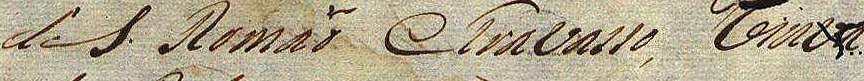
de S. Romaõ e Travasso, Viuva
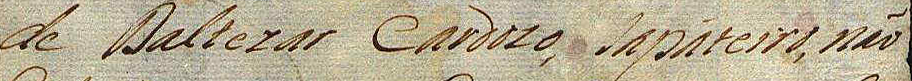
de Baltezar cardozo, sapateiro, naõ
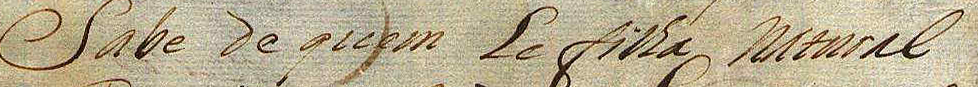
Sabe de quem he filha natural
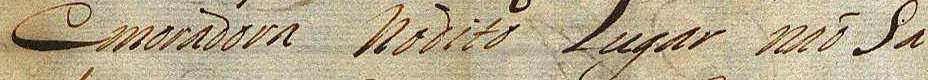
e moradora no dito Lugar naõ Sa
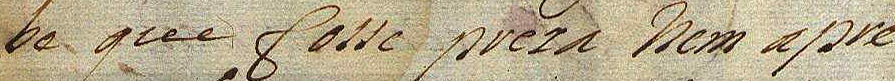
be que fosse preza nem apre
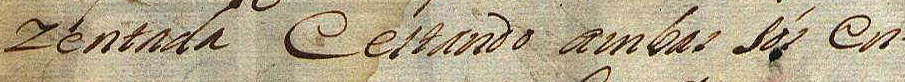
zentada e estando ambas sós en
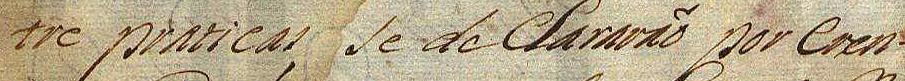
tre praticas, se declaravaõ por cren
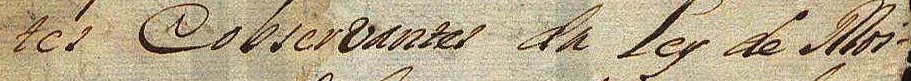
tes e observantes da Ley de Moi
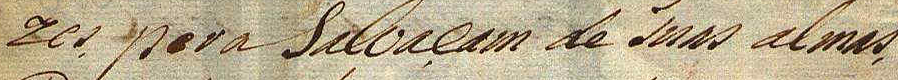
zes, pera Salvaçam de suas almas,
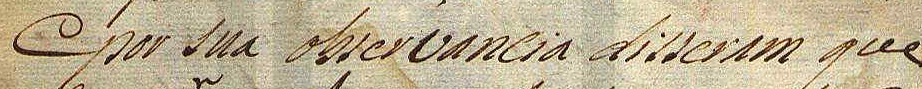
e por sua observancia disseram que
